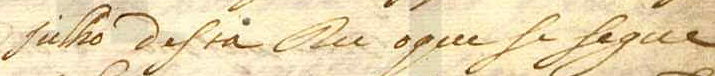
julho desta Ree o que se segue
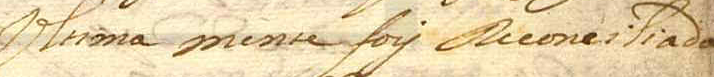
Vltimamente foy Reconciliada
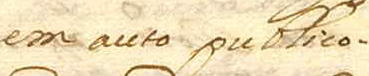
em auto publico.
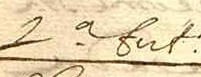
2.a feit.a
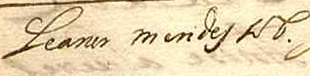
Leanor mendes solt.
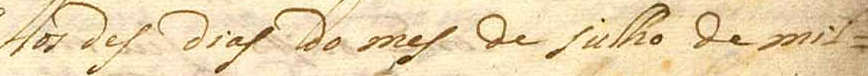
Aos des dias do mes de julho de mil
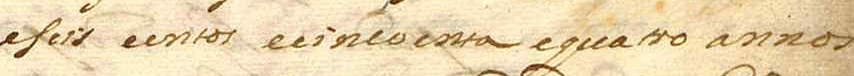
e seiscentos e cincoenta e quatro annos
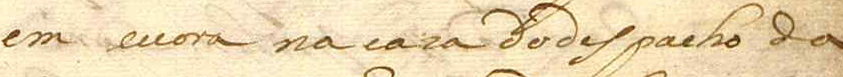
em euora na casa do despacho da
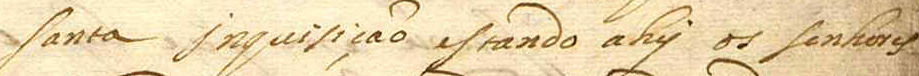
santa jnquisiçaõ estando ahy os senhores
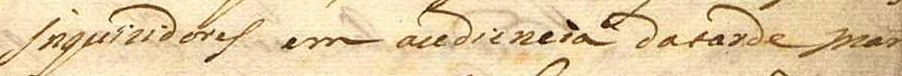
Jnquizidores em audiencia da tarde man
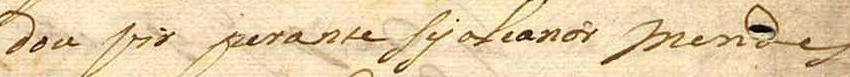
dou vir perante sy a Leanor mendes
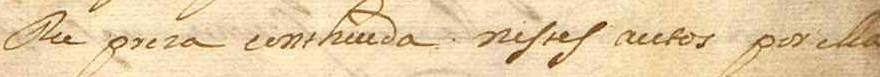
Ree preza contheuda nestes autos por ella
